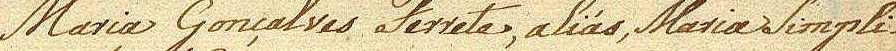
Maria Gonçalves Ferrete, aliás Maria Simpli
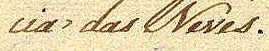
cia das Neves
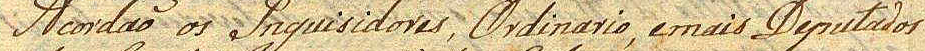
Acordaõ os Inquisidores, Ordinario, e mais Deputados
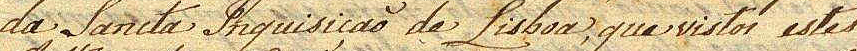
da Sancta Inquisiçaõ de Lisboa, que vistos estes
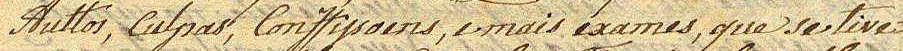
Auttos, Culpas, Coffissoens, e mais exames, que se tive
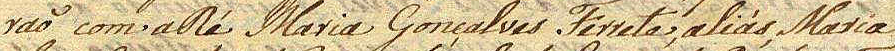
raõ com a Ré Maria Gonçalves Ferrete, aliás Maria
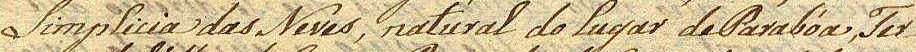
Simplicia das Neves, natural do lugar de Parabóa, Ter
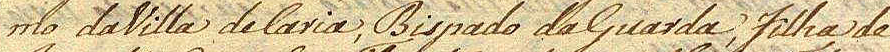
mo da Villa de Caria, Bispado da Guarda, filha de
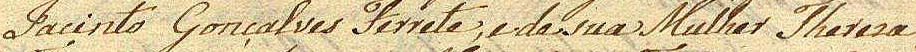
Iacinto Gonçalves Ferrete, e de sua Mulher Theresa
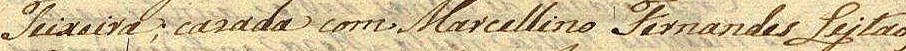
Teixeira, cazada com Marcellino Fernandes Leitaõ,
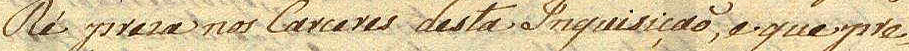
Ré preza nos Carceres desta Inquisiçaõ, e que pre
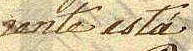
zente está.
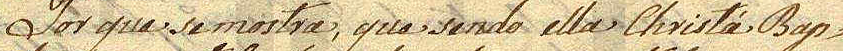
Por que se mostra, que sendo ella Christá, Bap
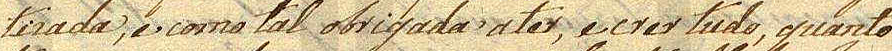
tizada, e como tal obrigada a ter, e crer tudo, quanto
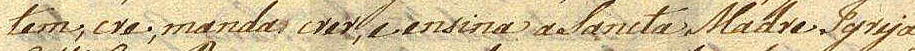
tem, cre, manda crer, e ensina a Sancta Madre Igreja
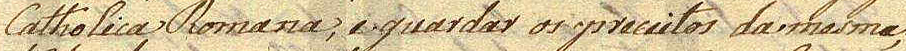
Catholica Romana, e guardar os preceitos da mesma,
